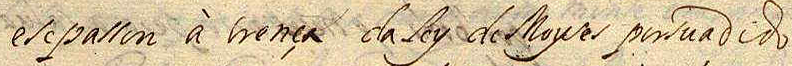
e se passou à crença da ley de Moyses persuadido
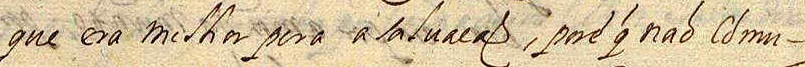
que era melhor pera a saluacaõ, porē q̄ naõ cōmu
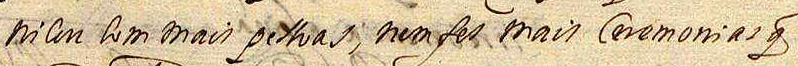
nicou com mais pessoas, nem fes mais Ceremonias q̄
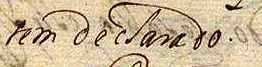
tem declarado.
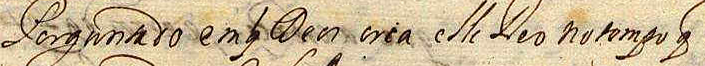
Perguntado em q̄ Deos cria elle Reo no tempo q̄
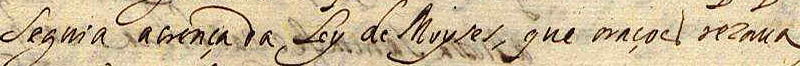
seguia a crença da Ley de Moyses, que oraçoes rezaua,
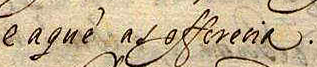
e a quē as offerecia.
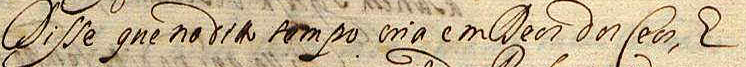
Disse que no ditto tempo cria em Deos dos Ceos, E
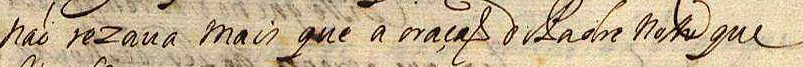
naõ rezaua mais que oraçaõ do Padre nosso que
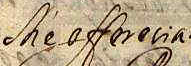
lhe offerecia.
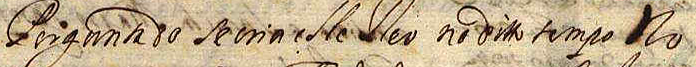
Perguntado se cria elle Reo no ditto tempo No
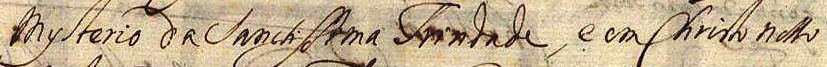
Mysterio da Sanctissima Trindade, e em Christo nosso
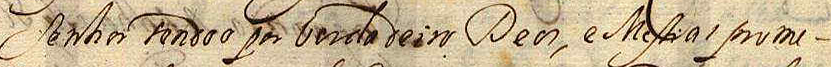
Senhor tendoo por verdadeiro Deos, e Messias prome
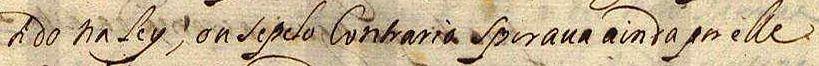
tido na ley, ou se pelo Contrario speraua ainda por elle
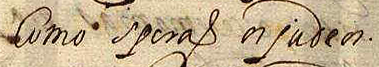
Como speraõ os judeos.
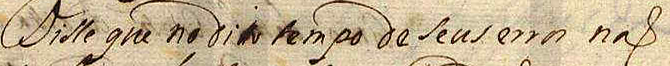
Disse que no ditto tempo de seus erros naõ
